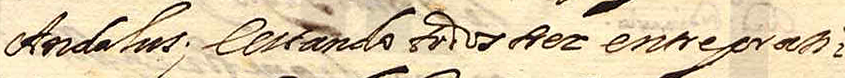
Andalus; e estando todos trez entre prati
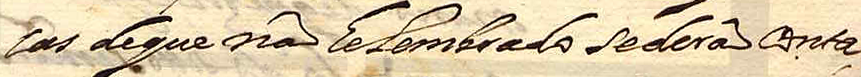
cas de que naõ he Lembrado se deraõ conta,
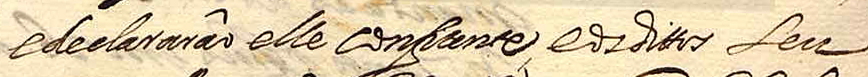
e declararão elle confitente, e os dittos seu
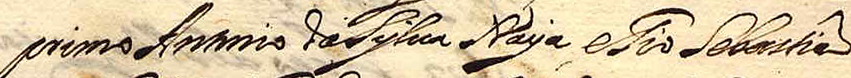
primo Antonio da Sylua Naya, e Tio Sebastiaõ
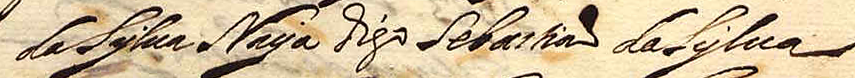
da Sylua Naya digo Sebastiaõ da Sylua
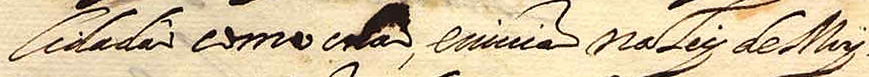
Cidadão como criaõ, e uiuiaõ na Ley de Moy
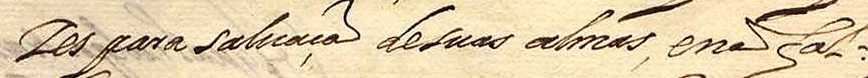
Zes para saluaçaõ de suas almas, e naõ fal
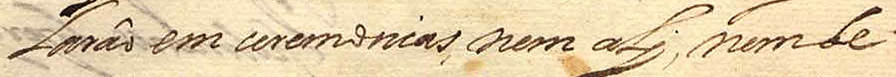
Larão em ceremonias, nem aLj, nem de
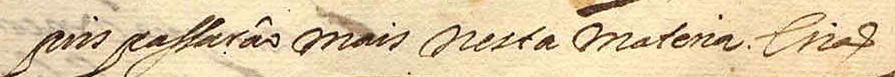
pois passarão mais nesta materia. E naõ
